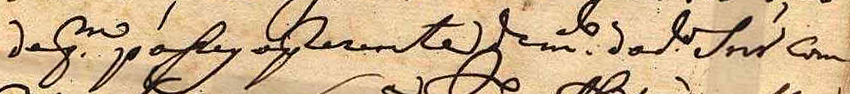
de q.m passey a pRezente de m.do do d.o snr Com
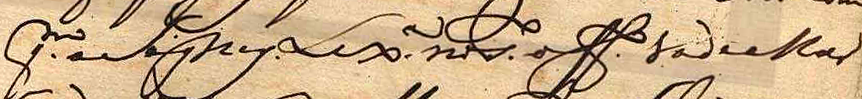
q.m a Signey Lix.a no s.to off.o 10 de Mar
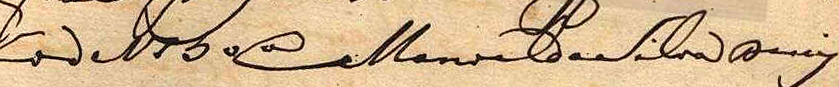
co de 1750 ā Manoel da Silva Denis
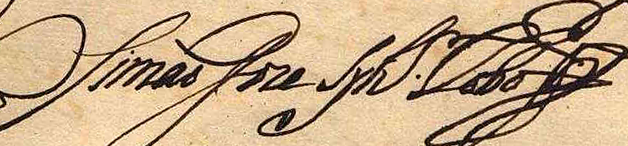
Simaõ Joze Sylv.r Lobo
